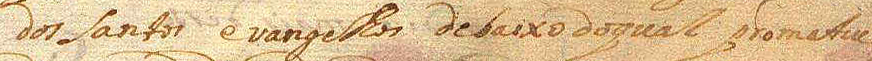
dos Santos evangelhos debaixo do qual prometeu
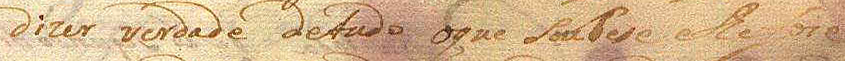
dizer verdade de tudo o que soubese e lhe fose
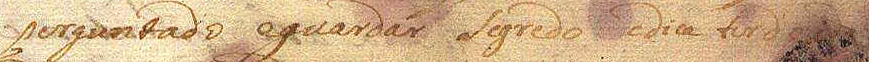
perguntado e guardar Segredo dice ter de ida
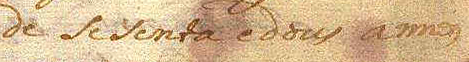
de sesenta e dous annos
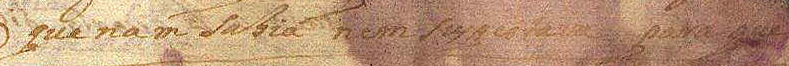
que nam sabia nem suspeitava para que
